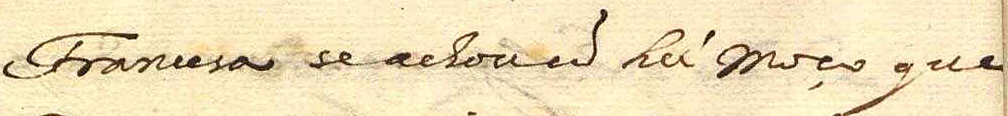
Francesa se achou cō hū moço que
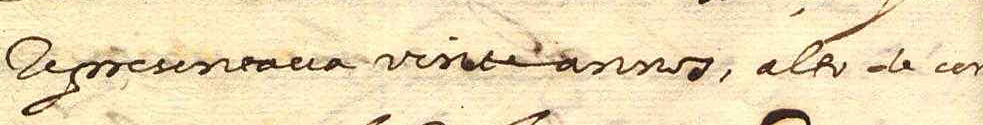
Representaua vinte annos, alto de cor
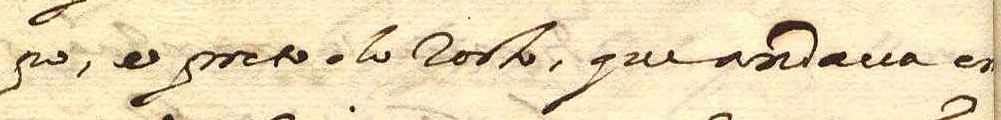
po, e preto do Rosto, que andaua em
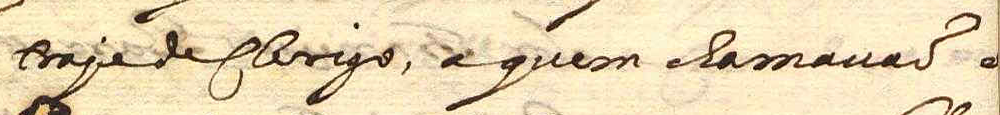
traje de Clerigo, a quem chamauaõ o
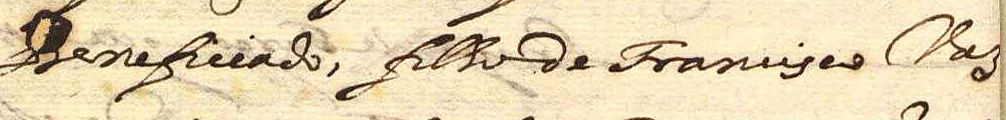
Beneficiado, filho de Francisco Vaz
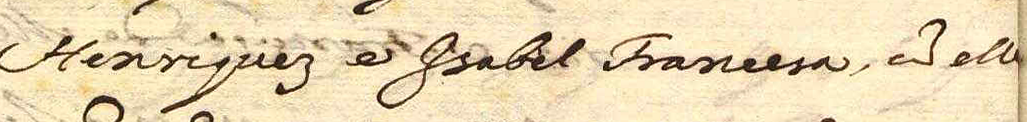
Henriquez e Jsabel Francesa, cō elle
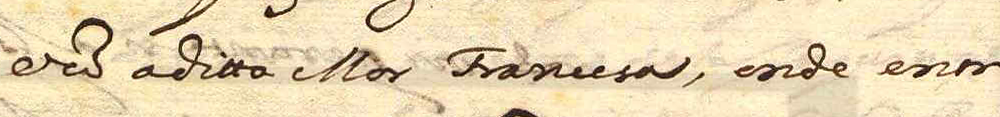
e cō a ditta Mor Francesa, onde entr
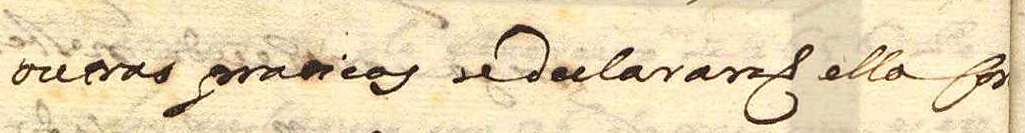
outras praticas se declararaõ ella Con
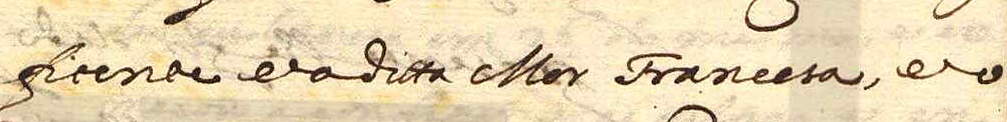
fitente e a ditta Mor Francesa, e o
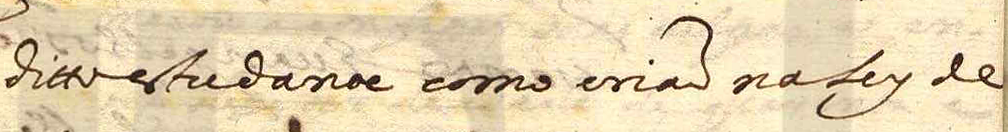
ditto estudante como criaõ na Ley de
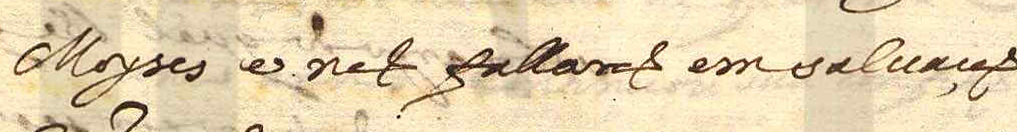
Moyses e naõ fallaraõ em saluaçaõ
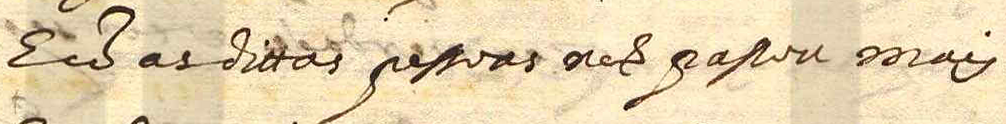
E cō as dittas pessoas naõ passou mais
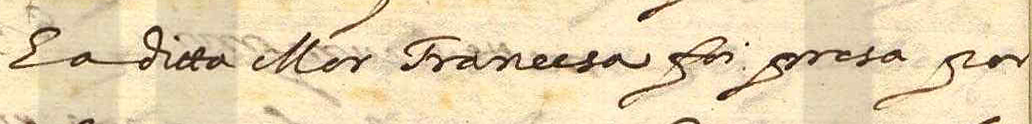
E a ditta Mor Francesa foi presa por
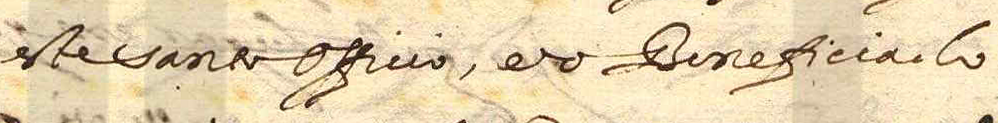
este santo officio, e o Beneficiado
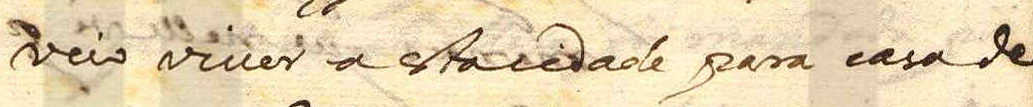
veio viuer a esta cidade para casa de
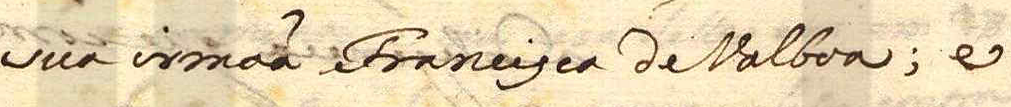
sua irmaã Francisca de Valboa; e
